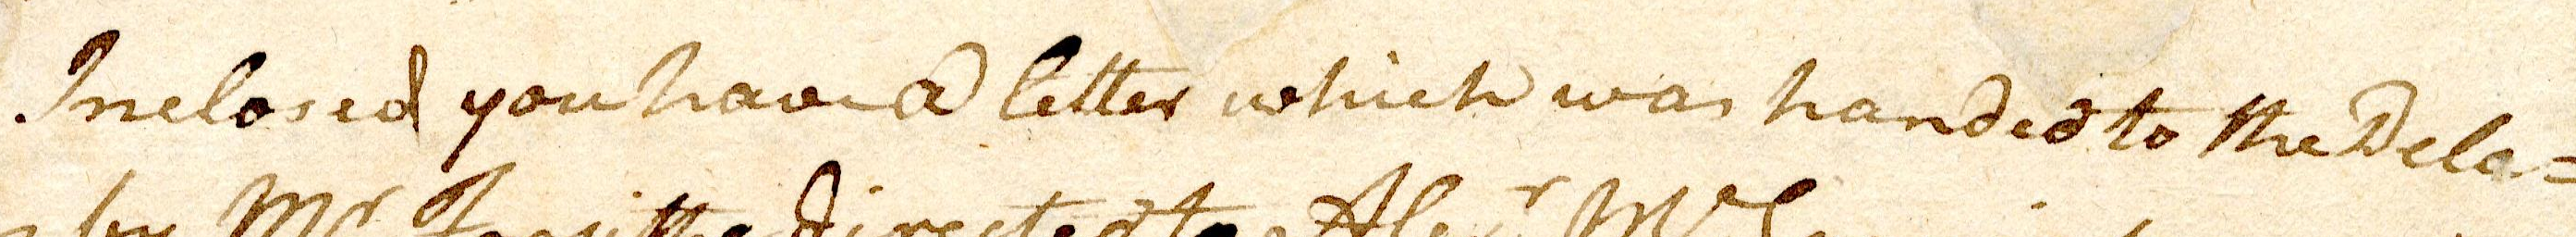Inclosed you have a letter which was handed to the Dela-
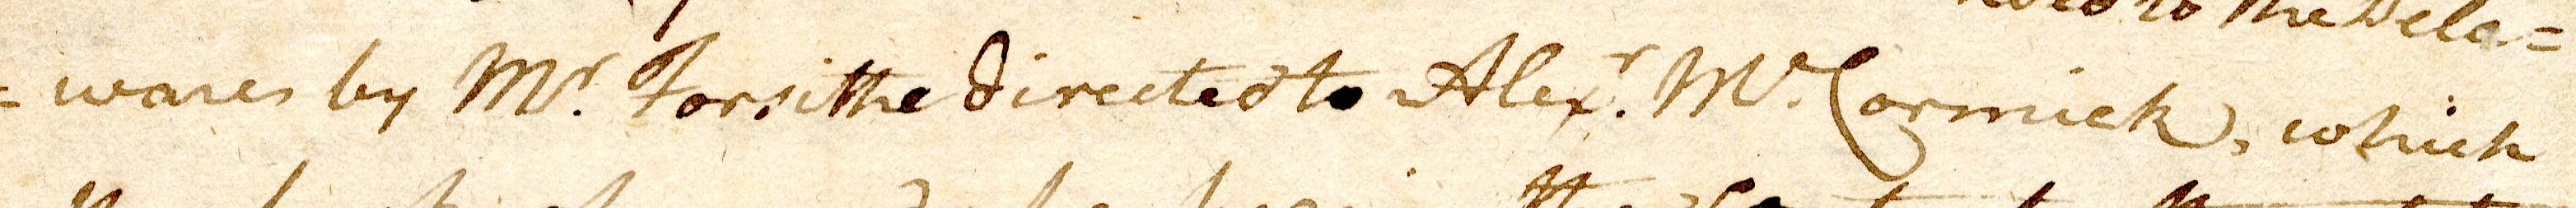-wares by M^r. Forsithe directed to Alex^r. M^cCormick, which
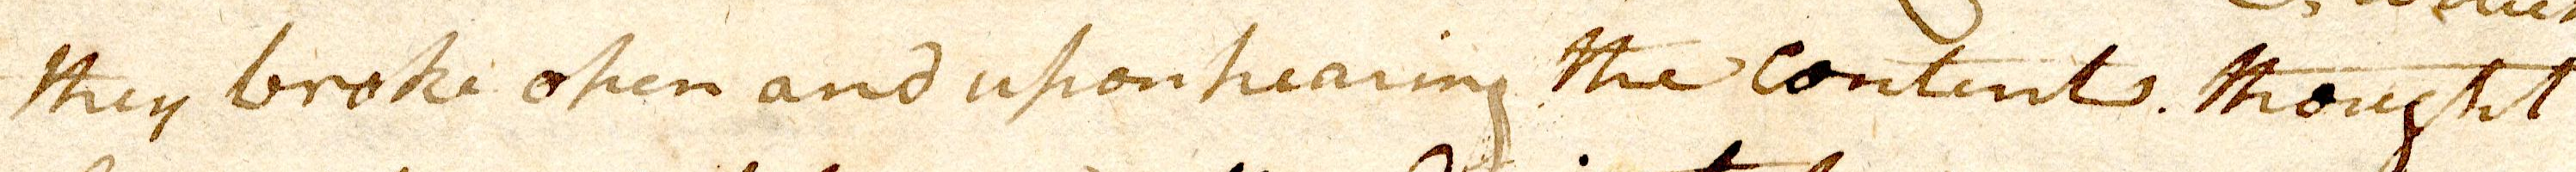they broke open and upon hearing the contents, thought
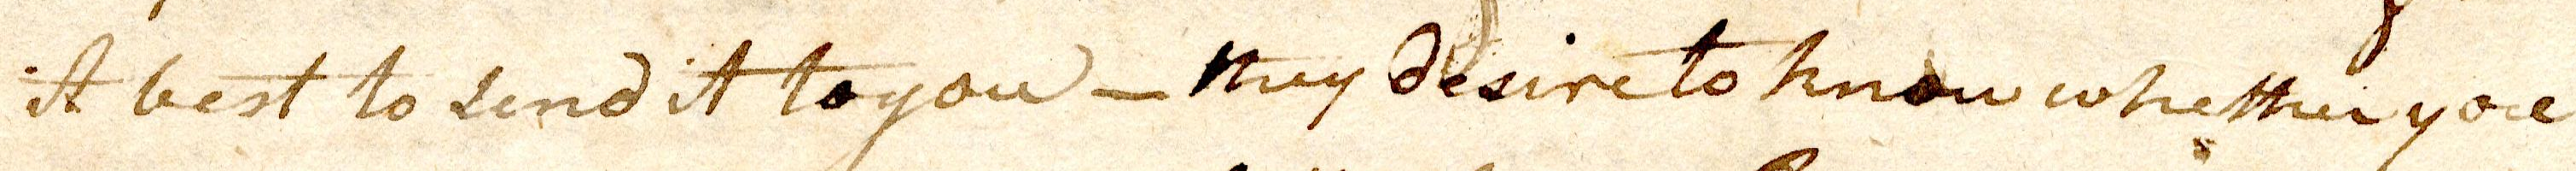it best to send it to you- they desire to know whether you
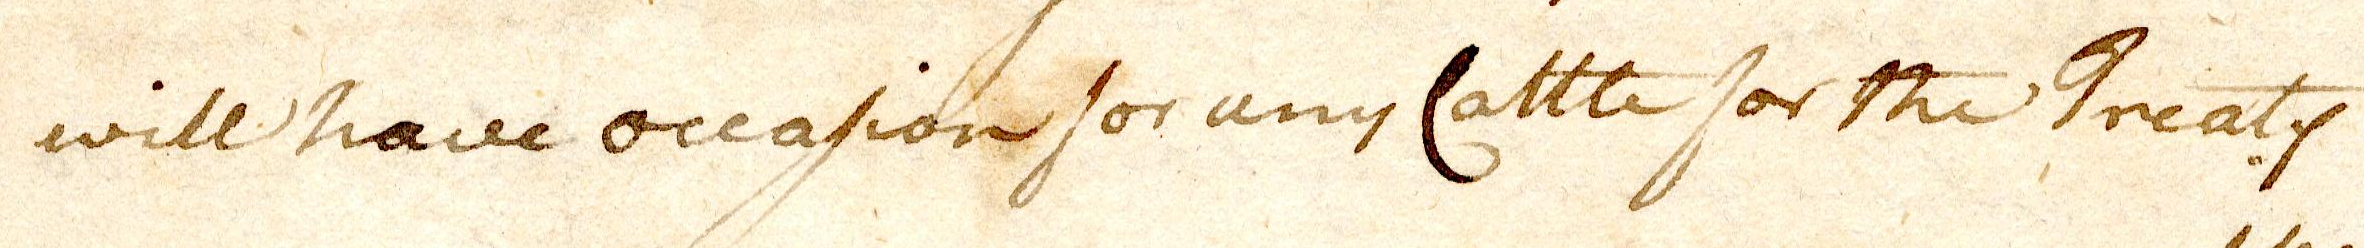will have occasion for any Cattle for the Treaty-
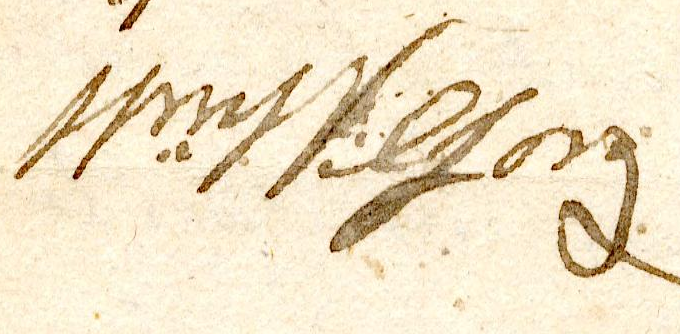W^m. Wilson
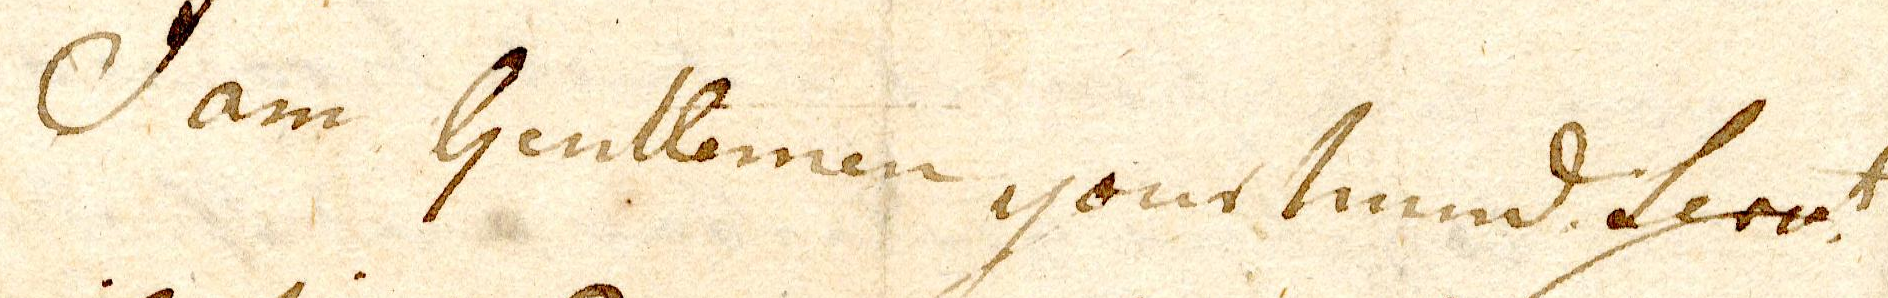I am Gentlemen your hum^l Serv^t
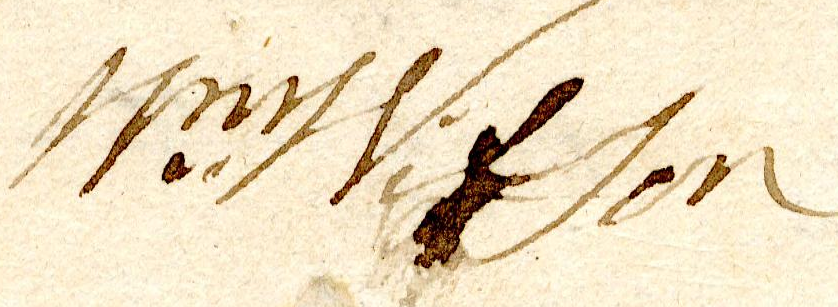Wm. Wilson.
